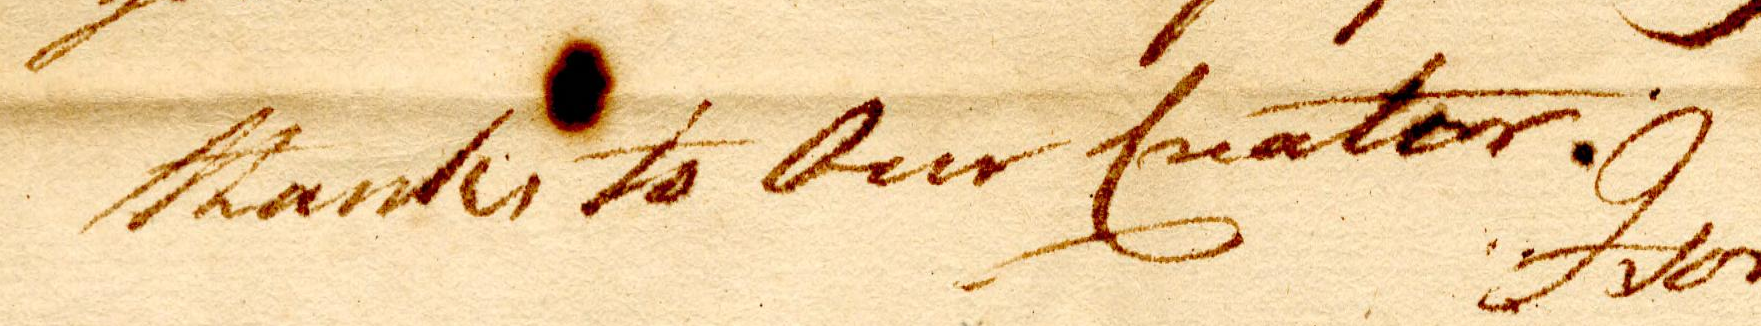thanks to Our Creator
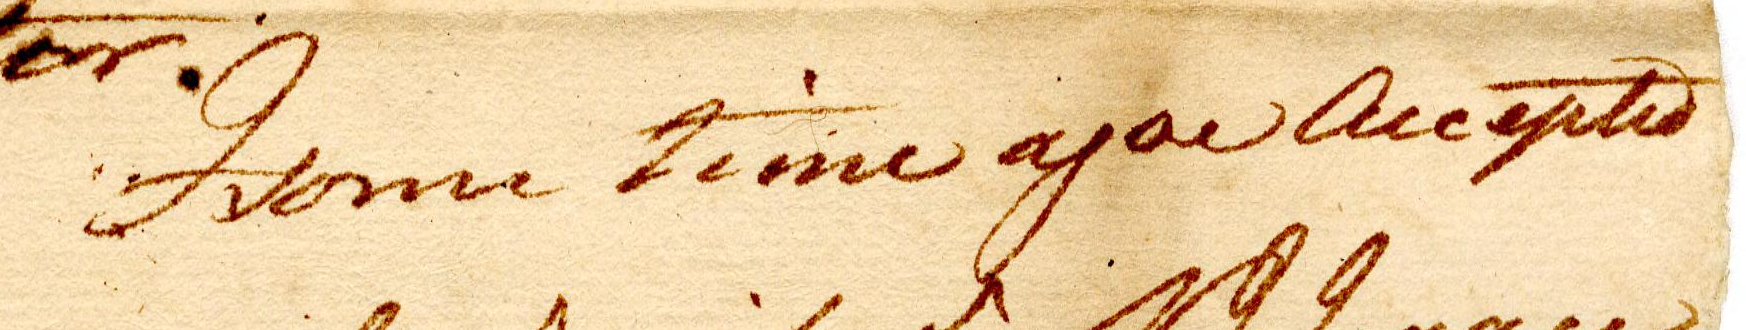Some time you Accepted
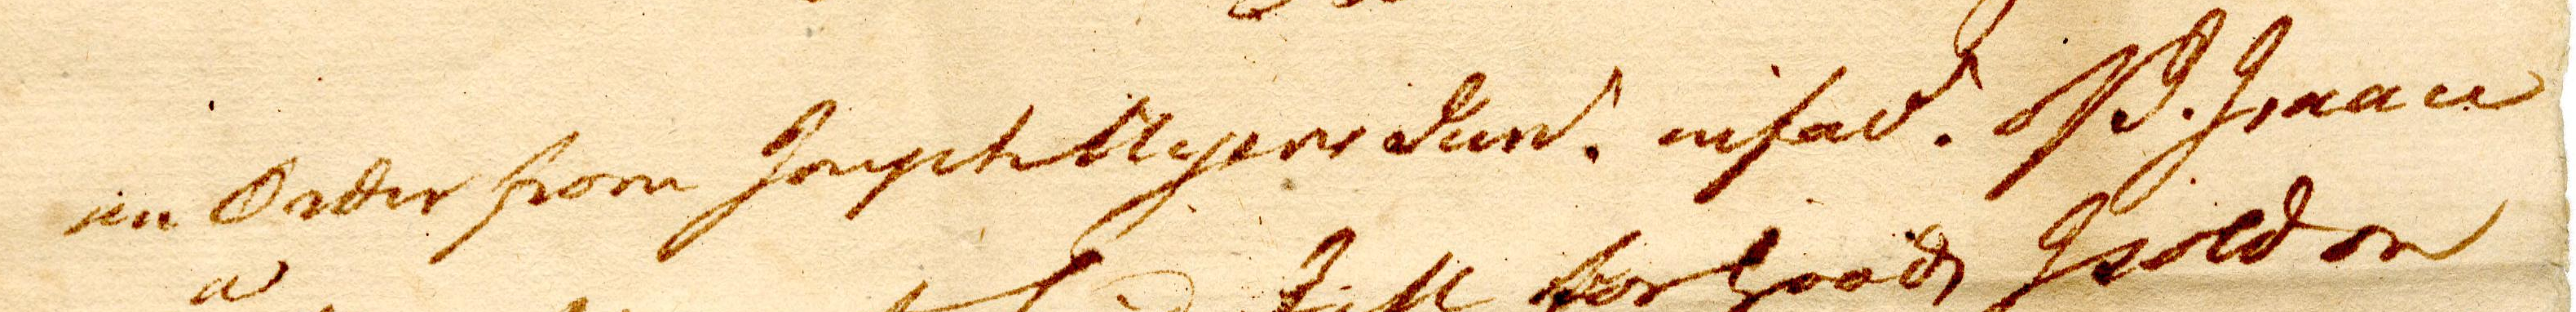an Order from Joseph Myers Jun^r. in fav^r. of I. Isaacs
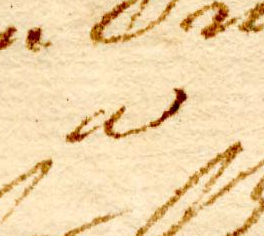a
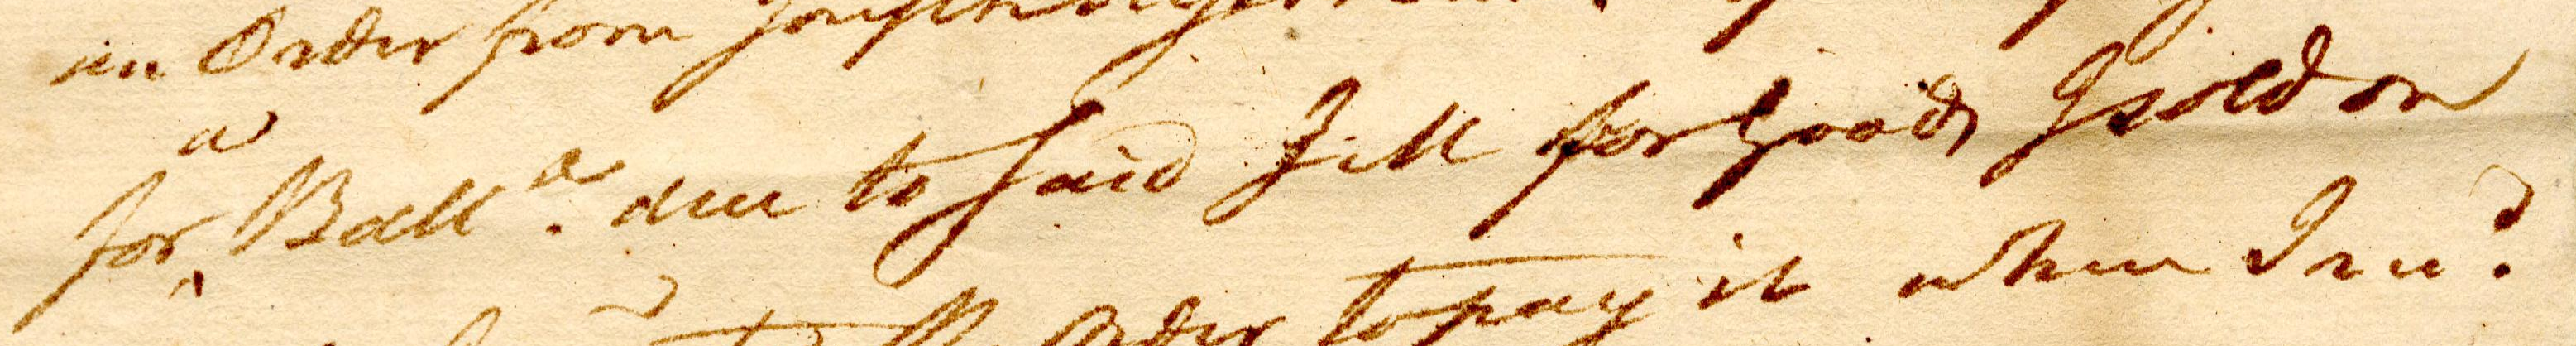for ^ Ball^a. due to said fill for goods I sold on
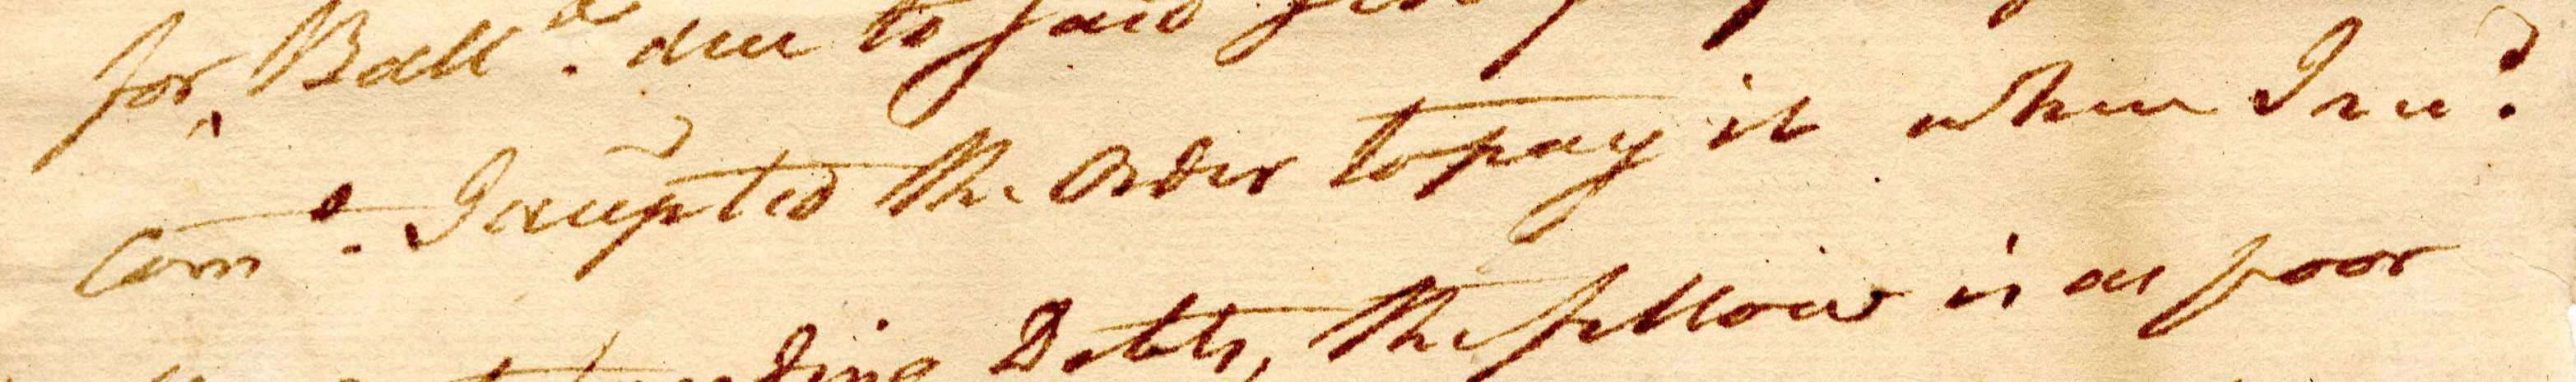com^n. I accepted the Order to pay it when I rec^d.
